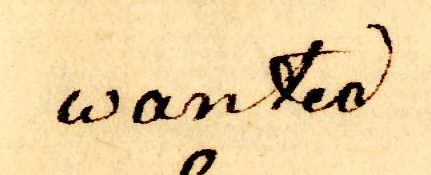wanted
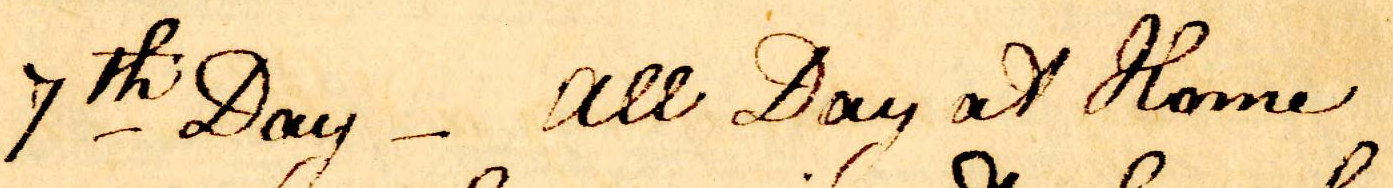7^th Day- All Day at Home
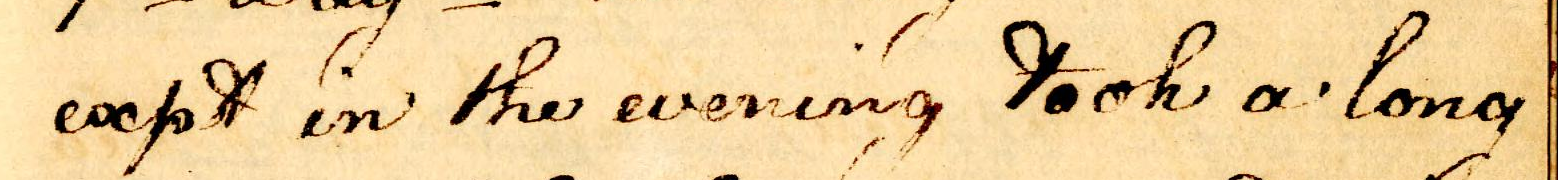expt in the evening took a long
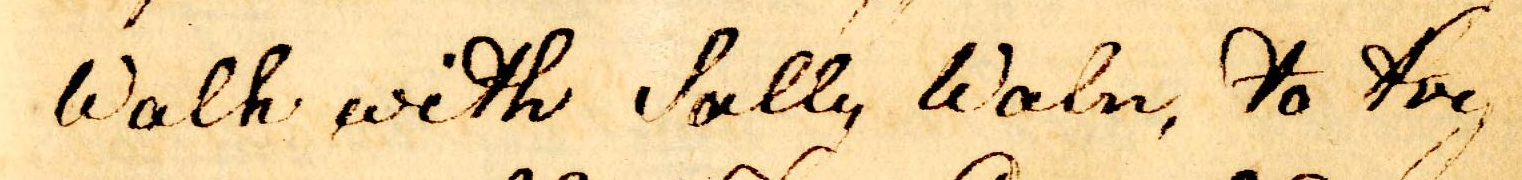Walk with Sally Waln, to try
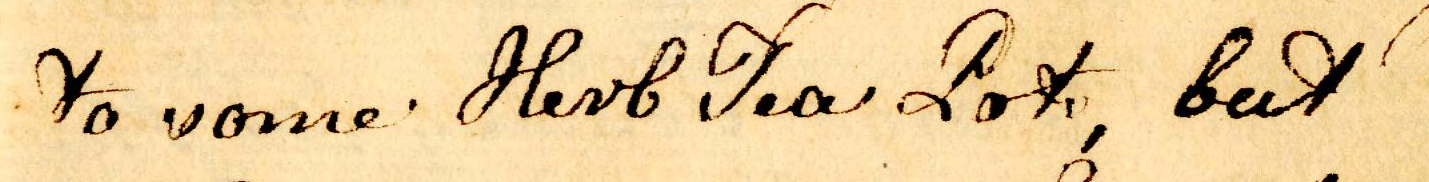to some Herb Tea Pots, but
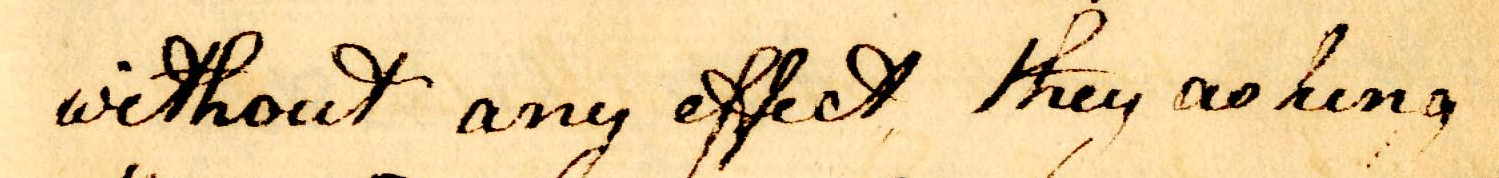without any effect, they asking
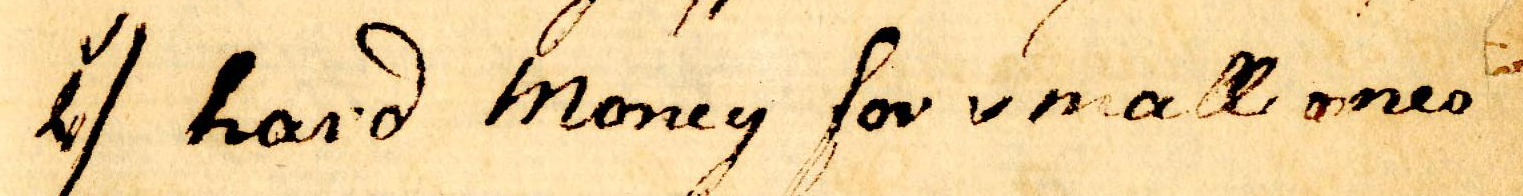4s hard Money for small ones
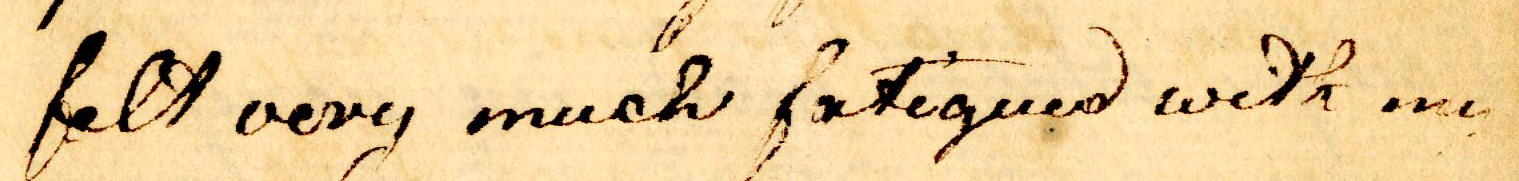felt very much fatigued with my
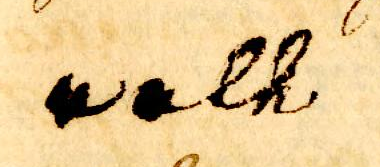walk
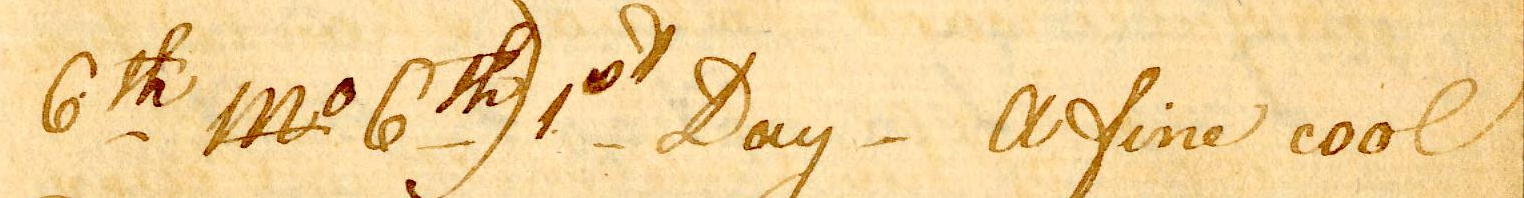6^th M^o 6^th) 1^st Day- A fine cool
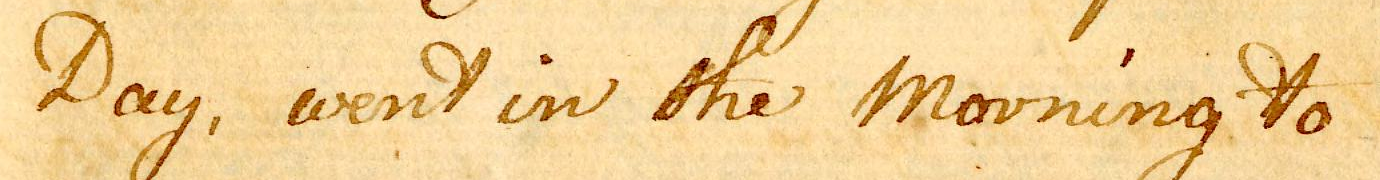Day, went in the Morning to
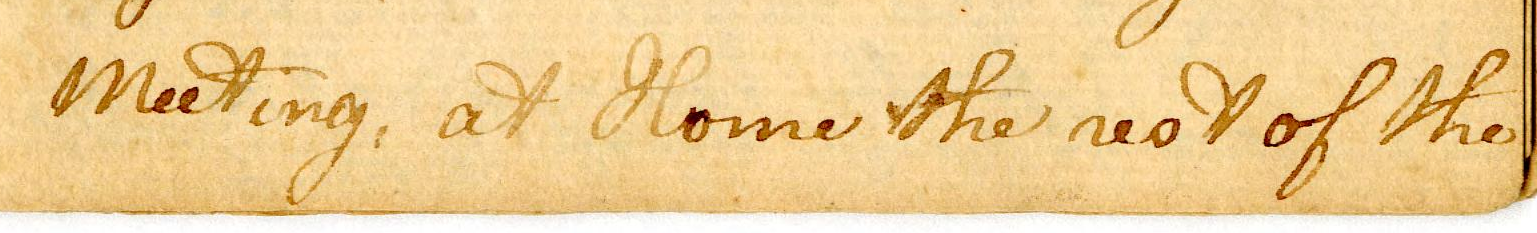Meeting, at Home the rest of the
